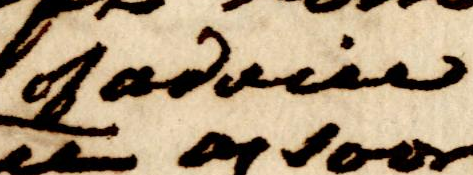of advice
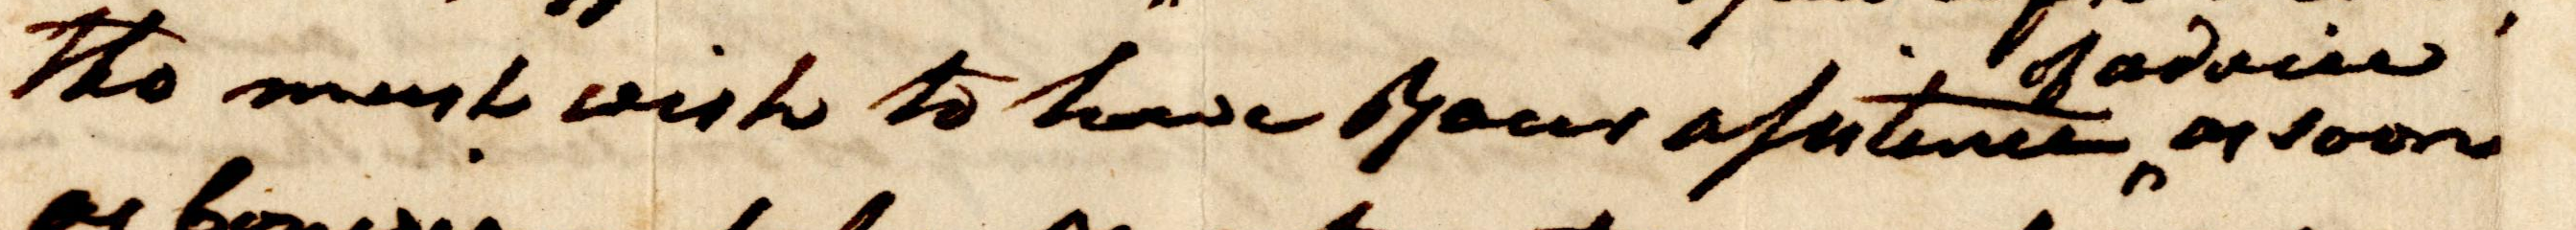tho mush wish to have your assistance ^ as soon
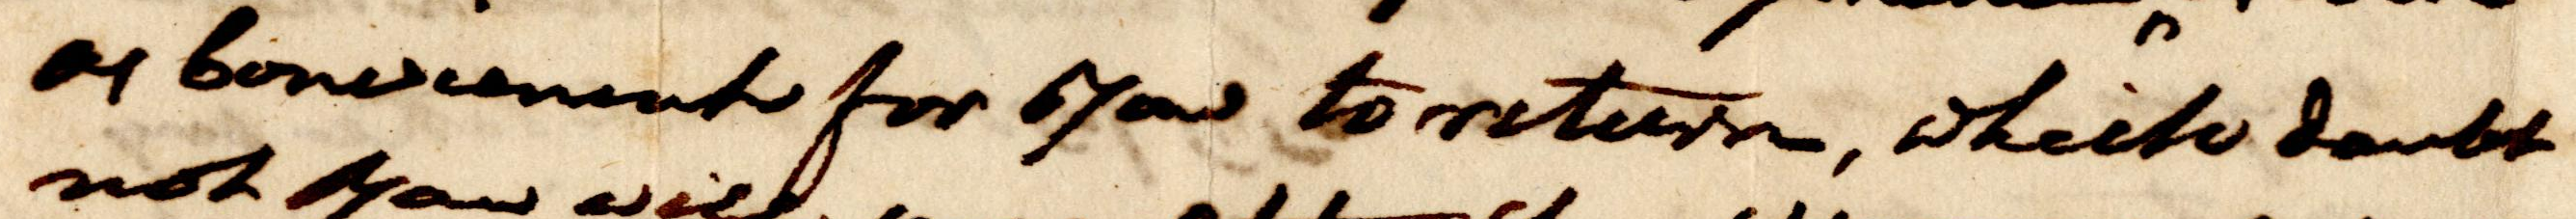as Convenient for you to return, which doubt
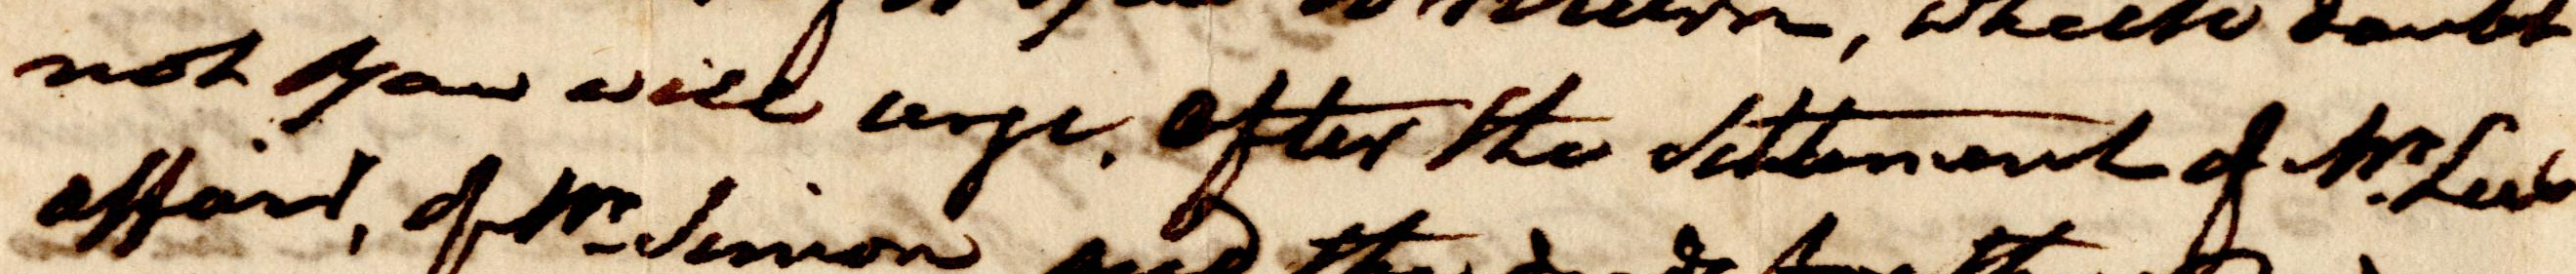not you will urge, after the Settlemant of M^r Lees
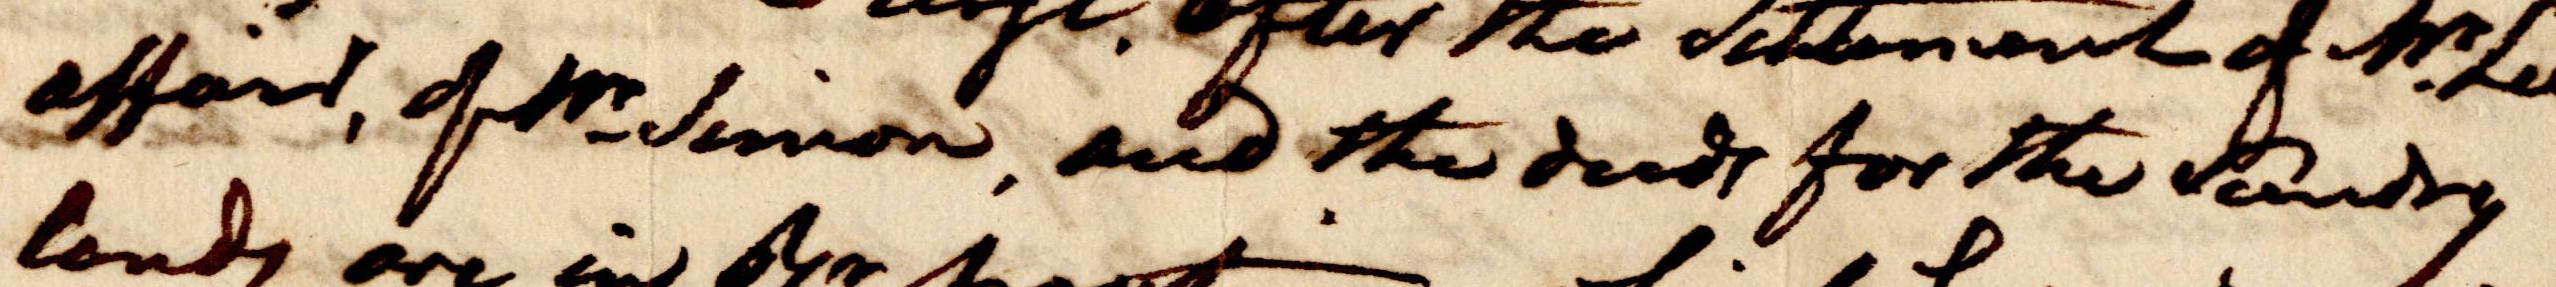affairs of M^r Simon, and the deeds for the sundry
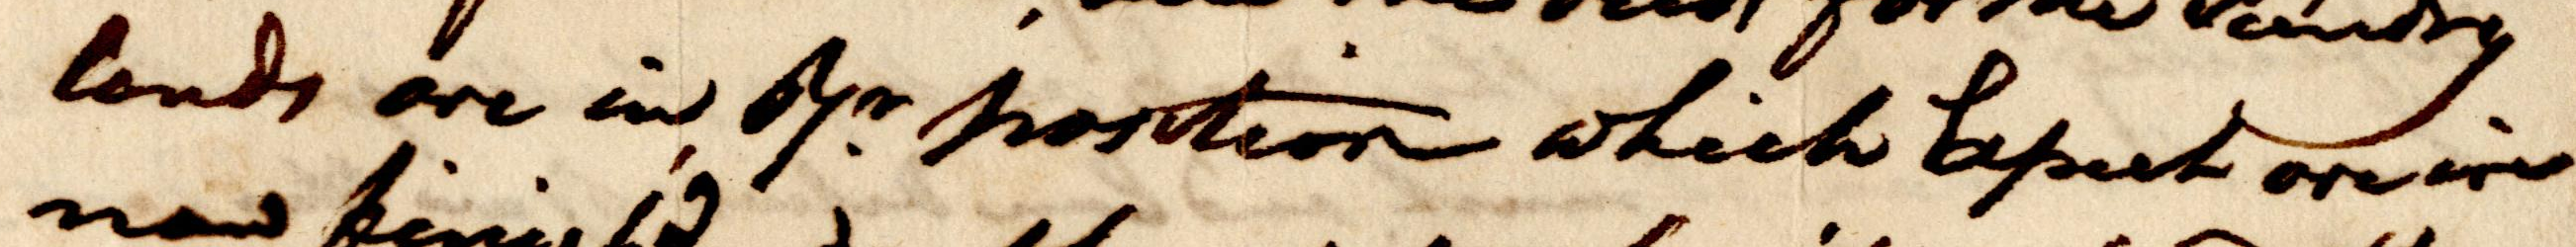lands are in y^r. position which Expect are in
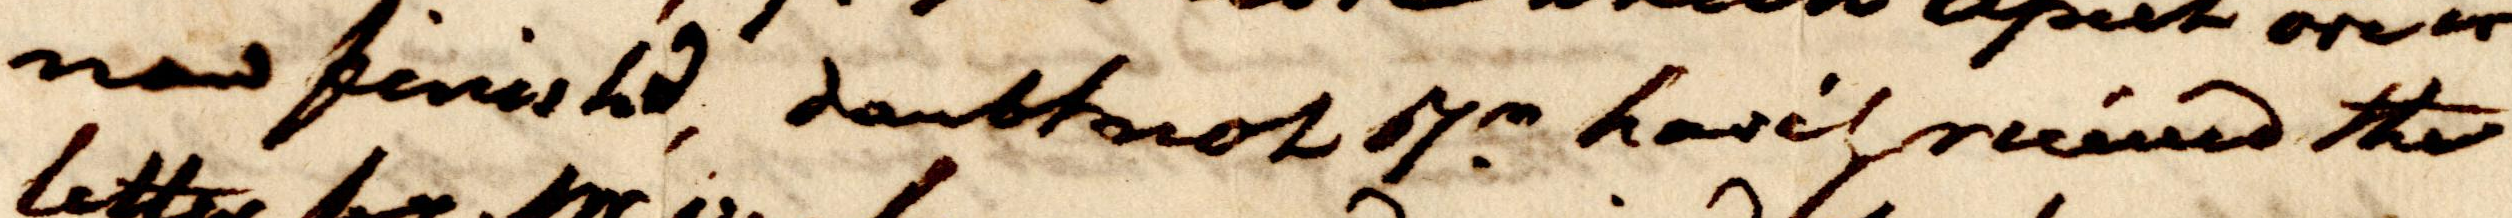now finish'd, doubt not y^r. have'g received the
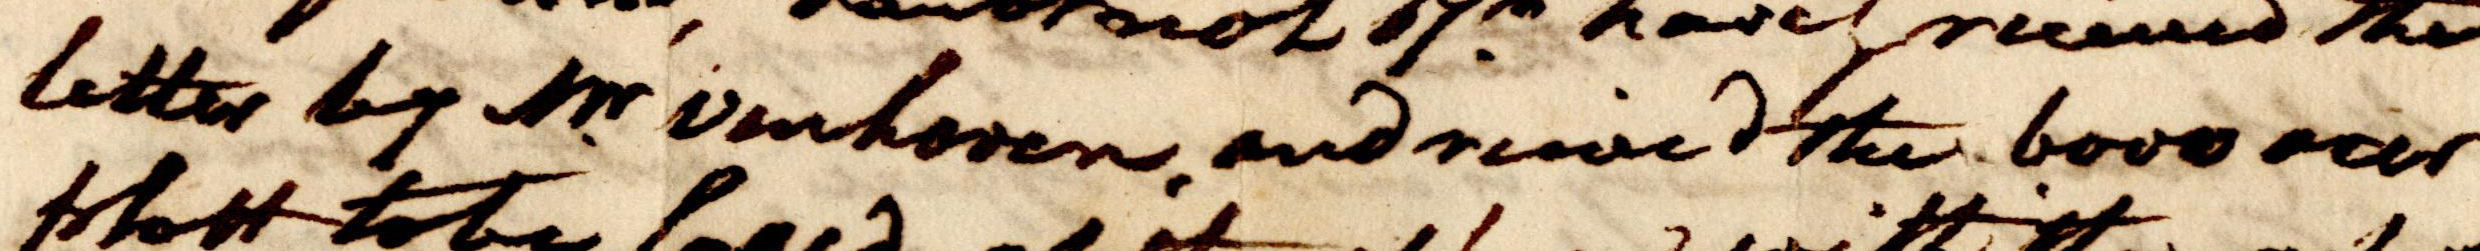letter by M^r Vinhoven and received the 6000 acer
